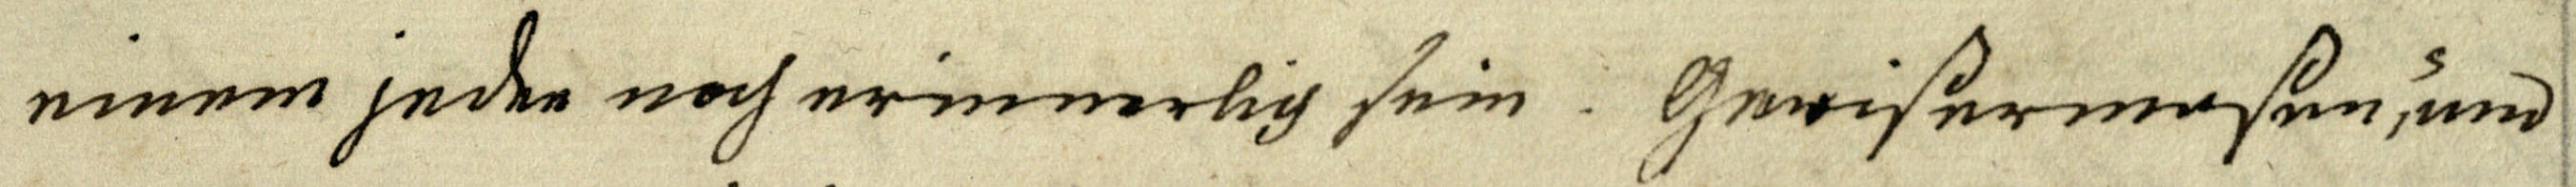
einem jeden noch erinnerlich sein. Gewißermaßen, und
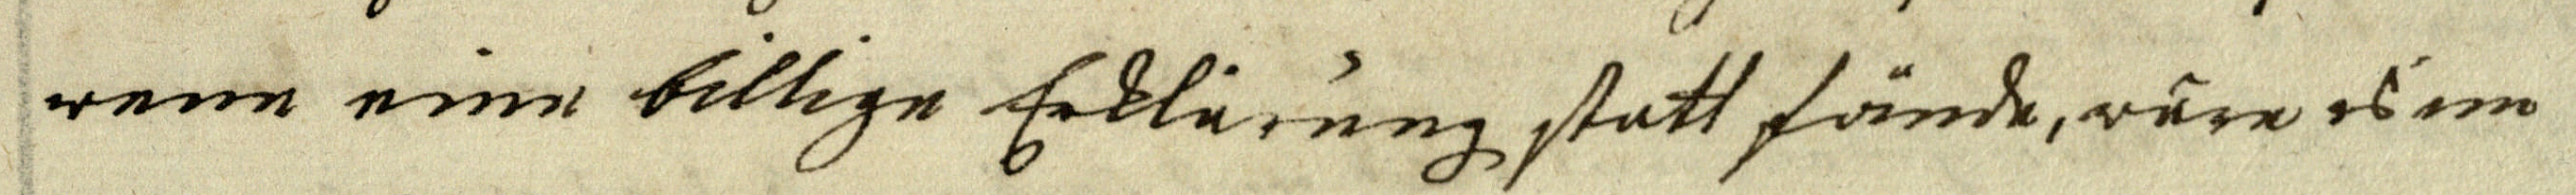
wenn eine billige Erklärung statt fände, wäre es im
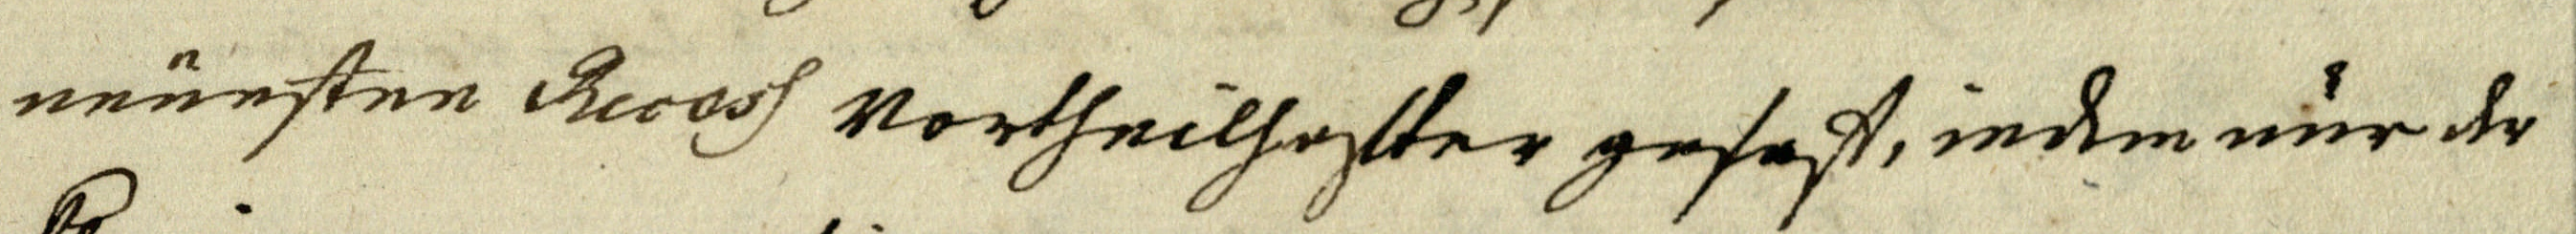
neuesten Recess votheilhafter gefast, indem nur der
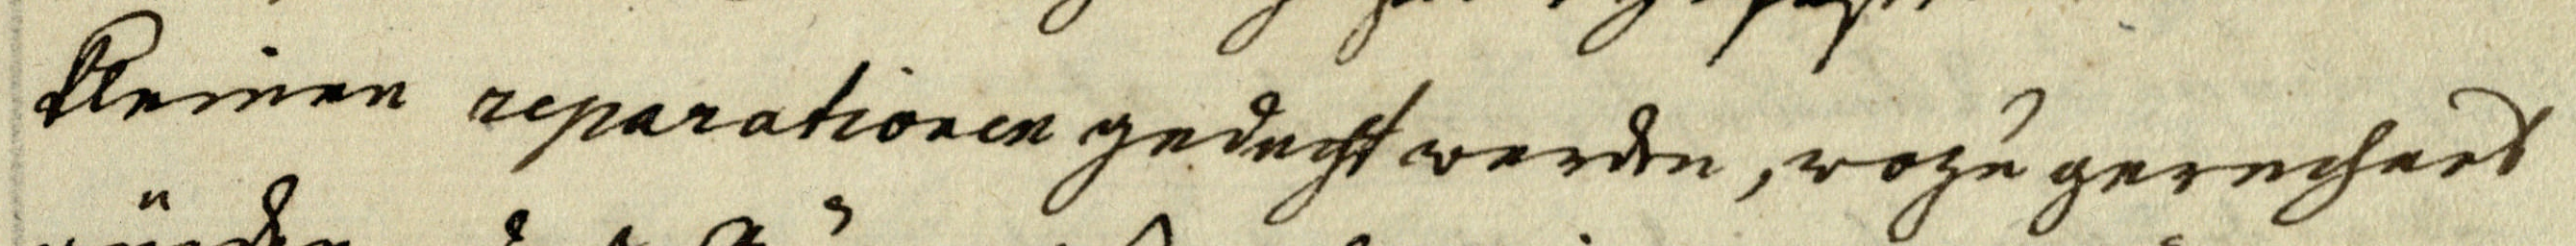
kleinen reparationen gedacht worden, wozu gerechnet
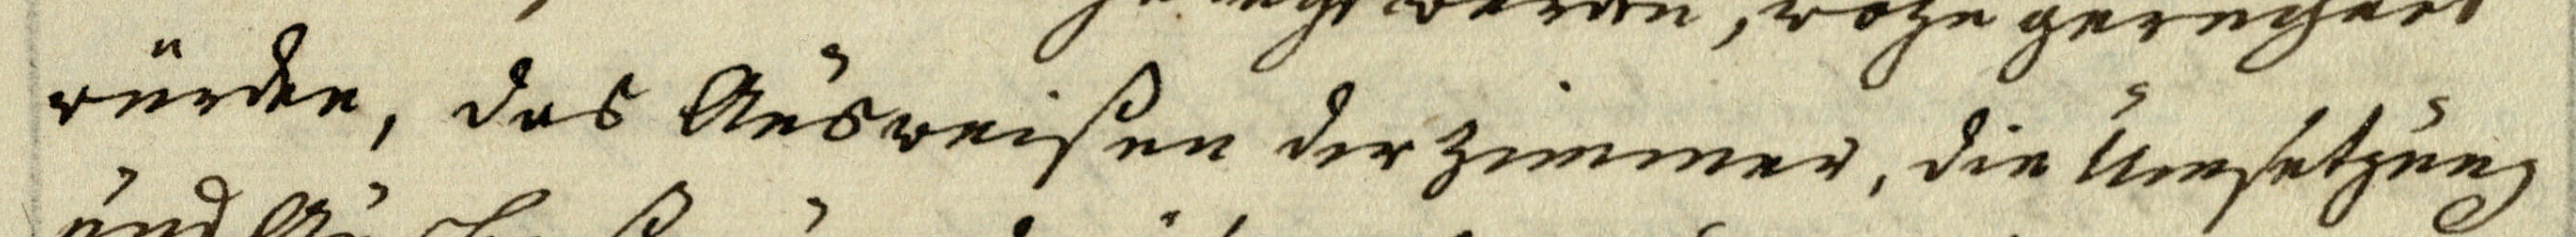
würden, das Ausweißen der Zimmer, die Umsetzung
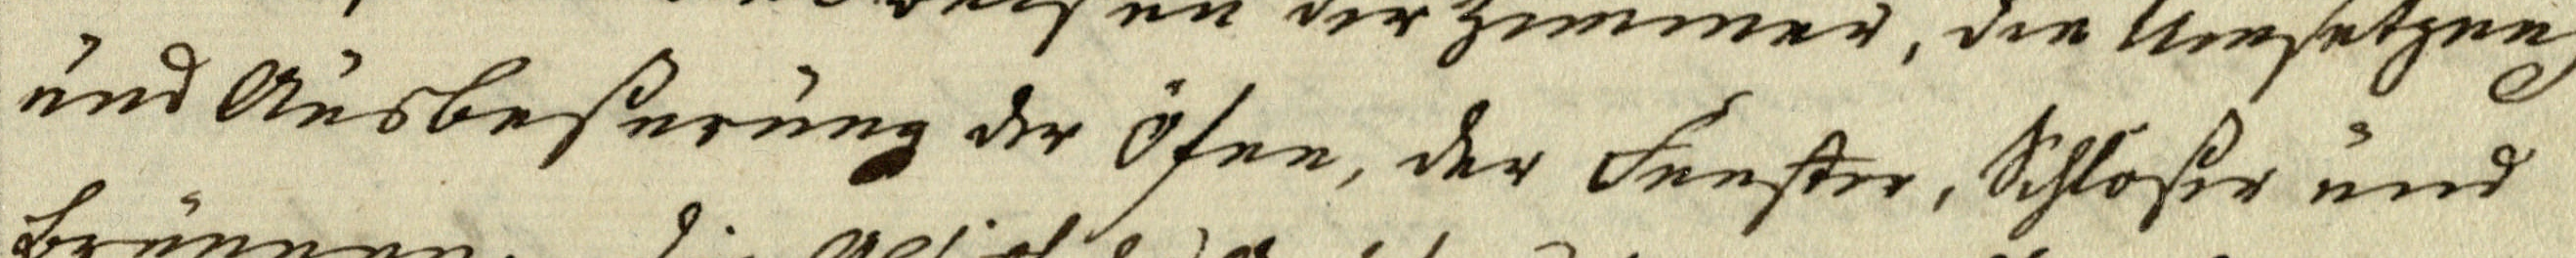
und Ausbeßerung der Öfen, der Fenster, Schlößer und
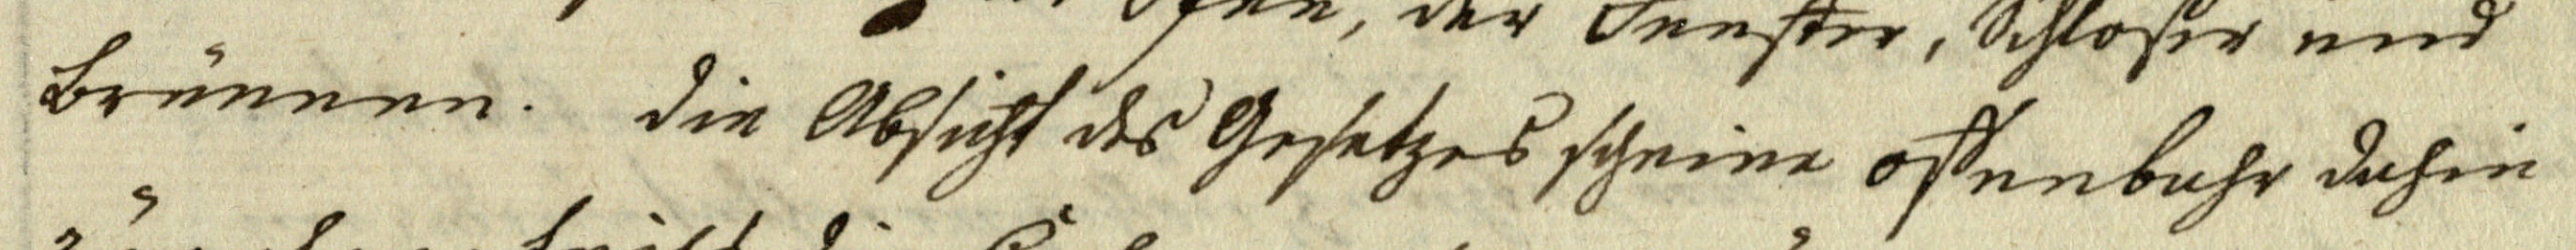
Brunnen. Die Absicht des Gesetzes scheine offenbahr dahin
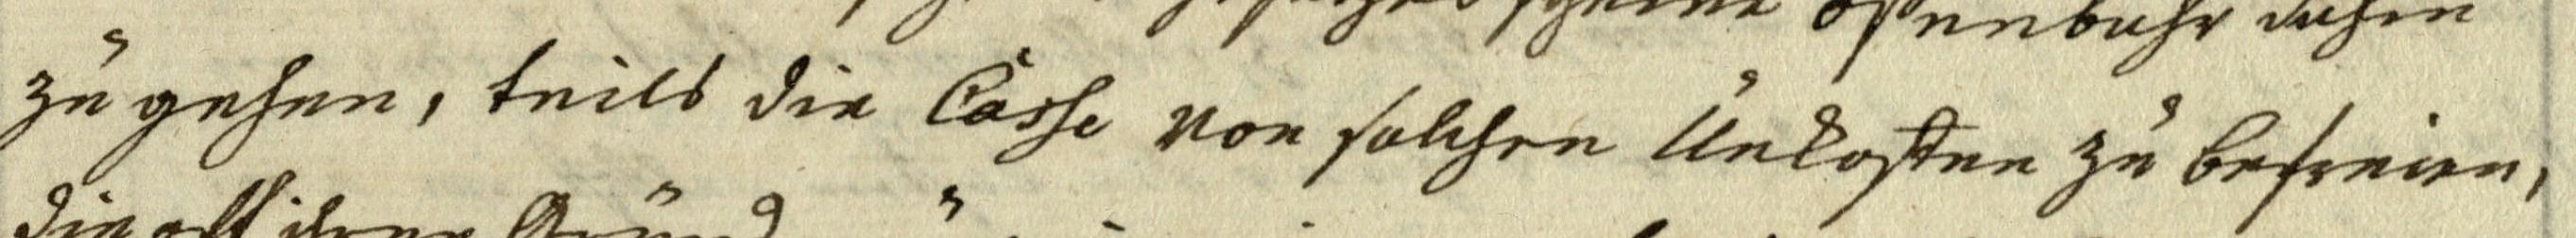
zu gehen, teils die casse von solchen Unkosten zu befreien,
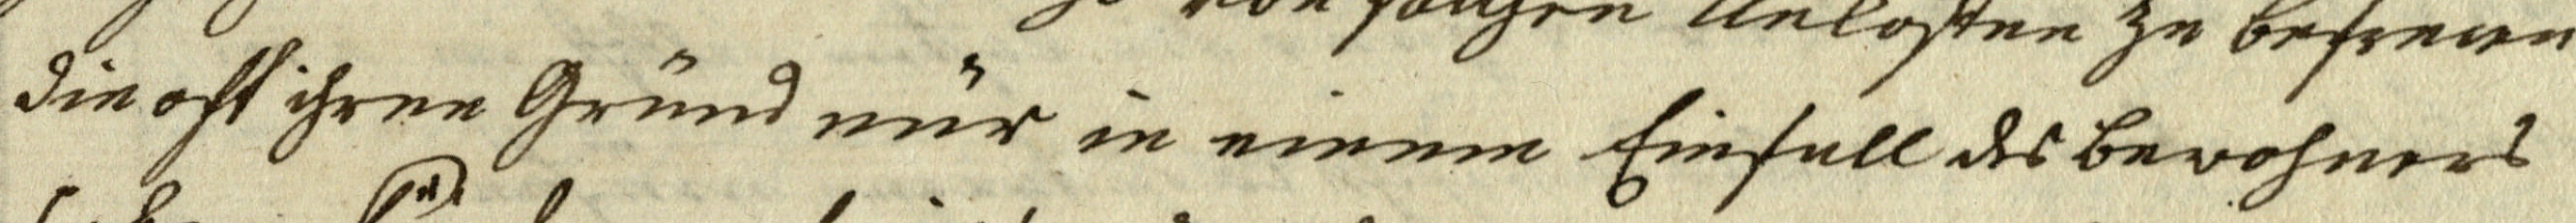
die oft ihren Grund nur in einem Einfall des Bewohners
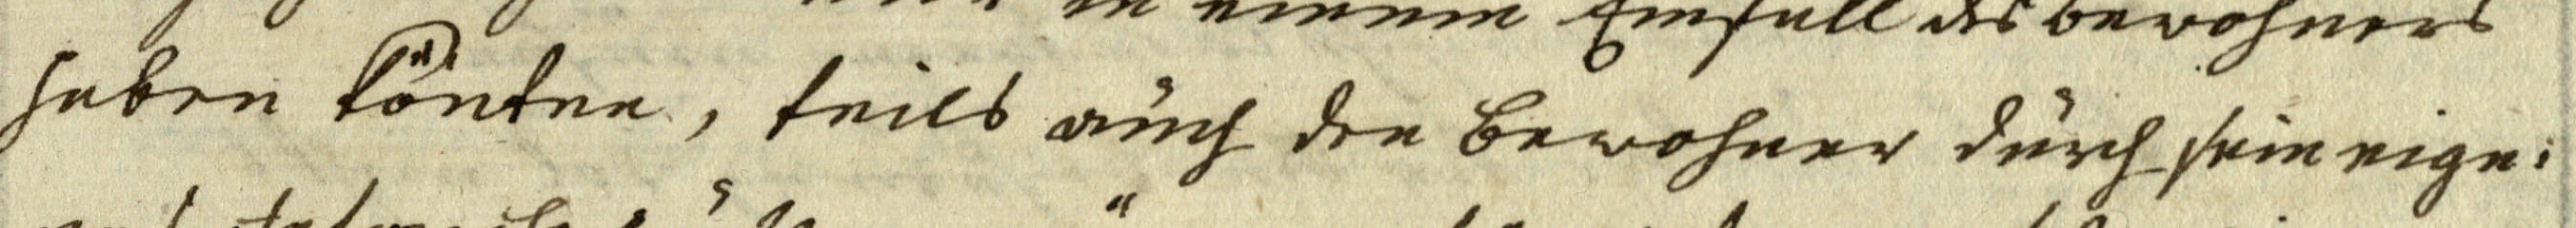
haben könten, teils auch den Bewohner durch sein eige¬
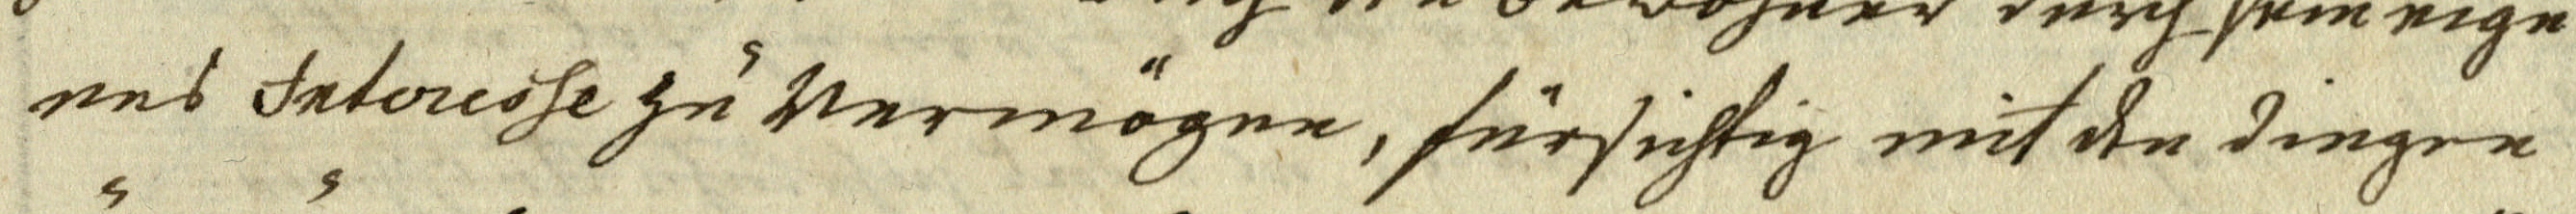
nes Interesse zu vermögen, fürsichtig mit den Dingen
